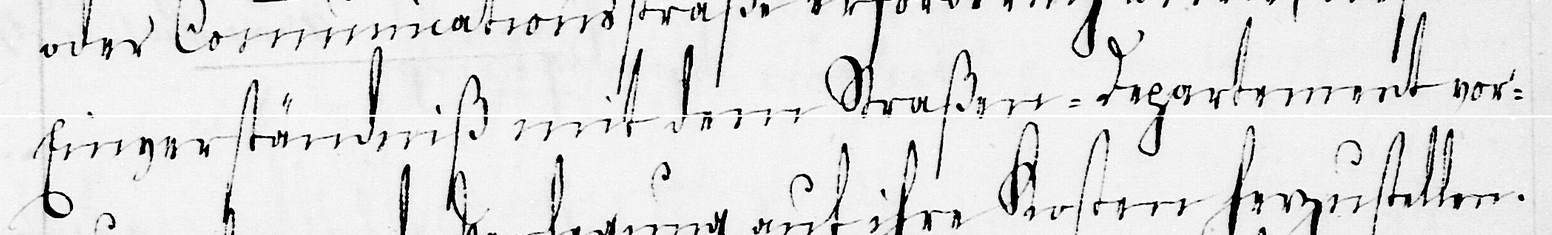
Einverständniß mit dem Straßen-Departement vor¬
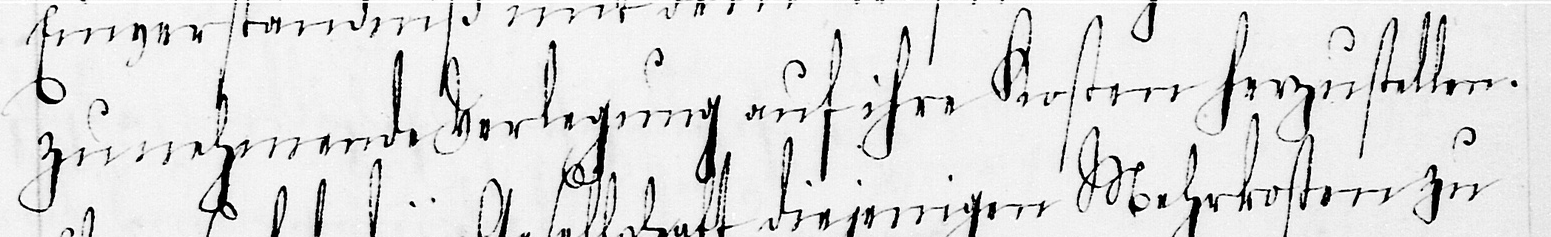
zunehmende Verlegung auf ihre Kosten herzustellen.
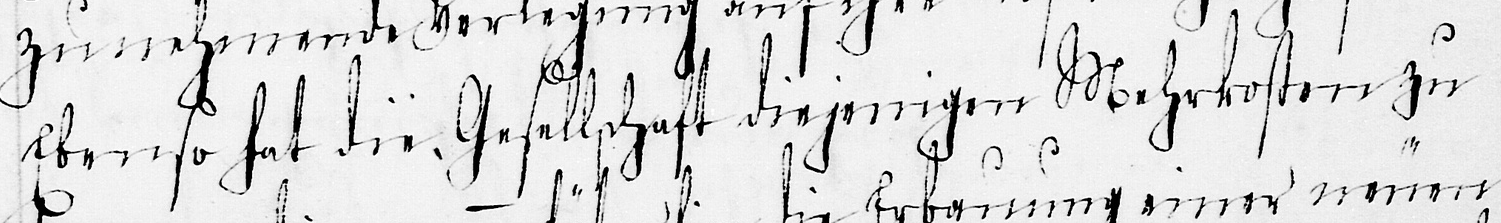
Ebenso hat die Gesellschaft diejenigen Mehrkosten zu
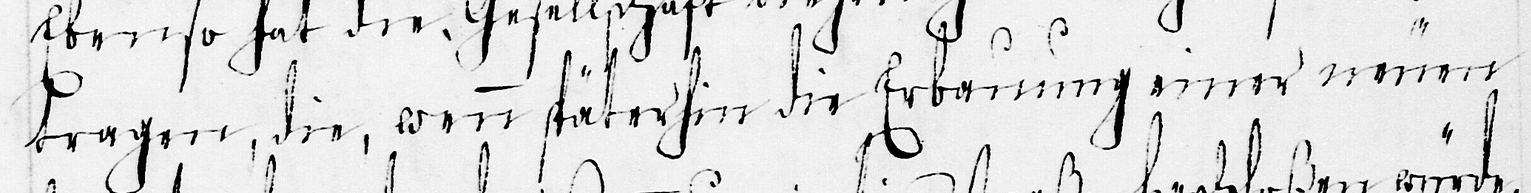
tragen, die, wenn späterhin die Erbauung einer neuen
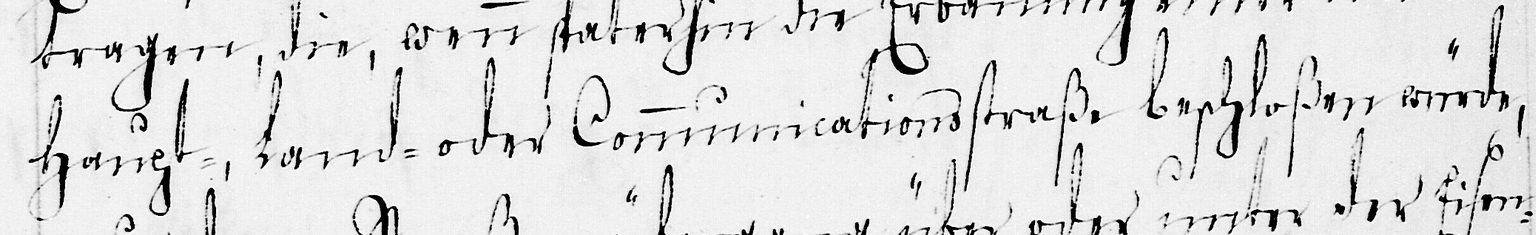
Haupt-, Land- oder Communicationsstraße beschloßen würd¬
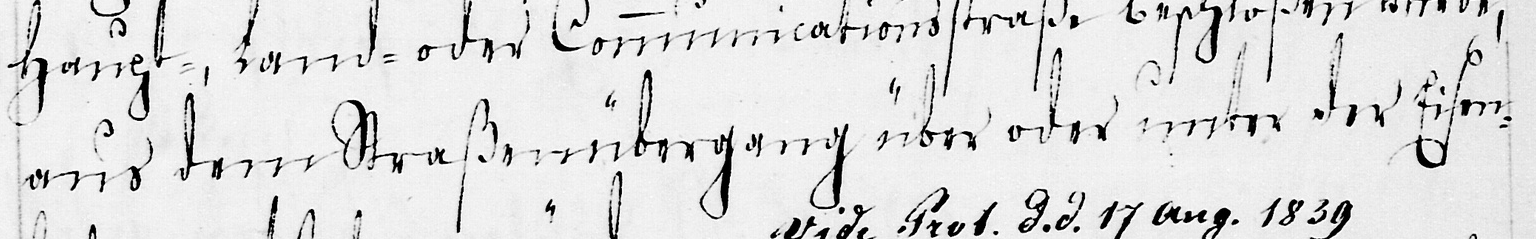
aus dem Straßenübergang über oder unter der Eisen¬
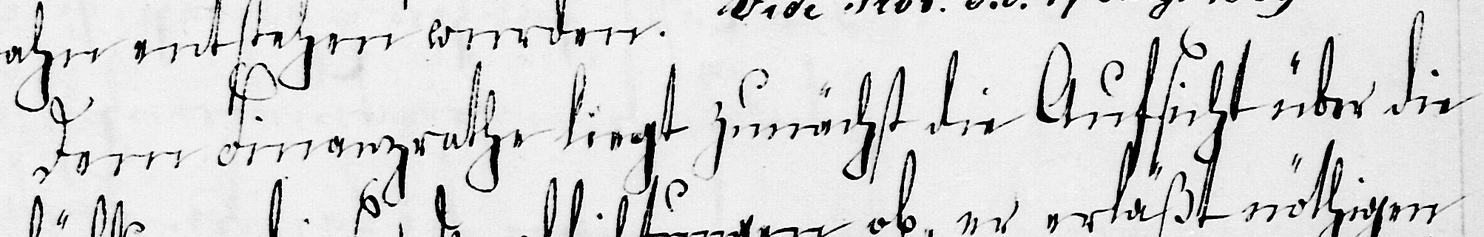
Dem Finanzrathe liegt zunächst die Aufsicht über die
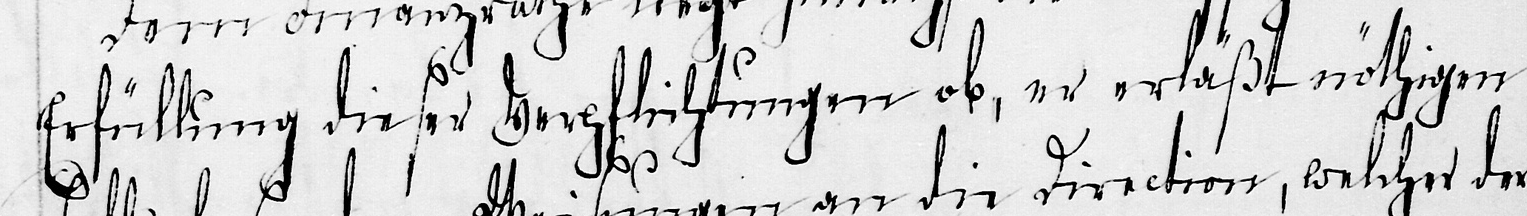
Erfüllung dieser Verpflichtungen ob, er erläßt nöthigen
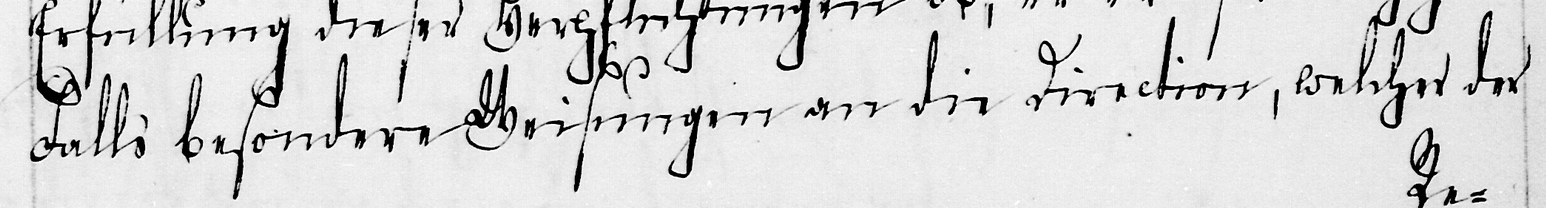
Falls besondere Weisungen an die Direction, welcher der
